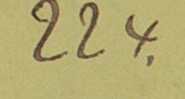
224
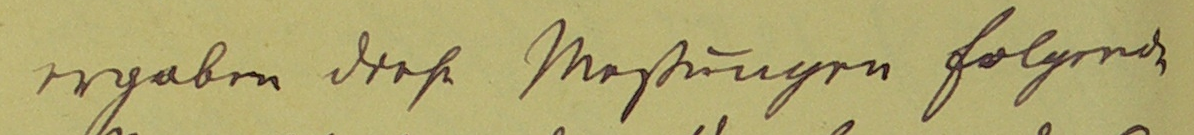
ergaben diese Messungen folgende
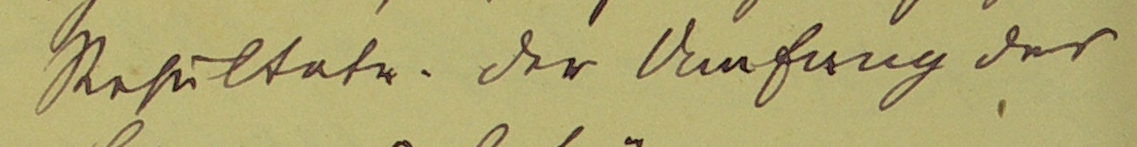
Resultate. Der Umfang des
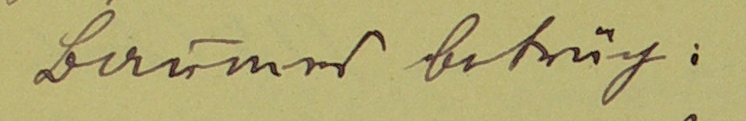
Baumes betrug:
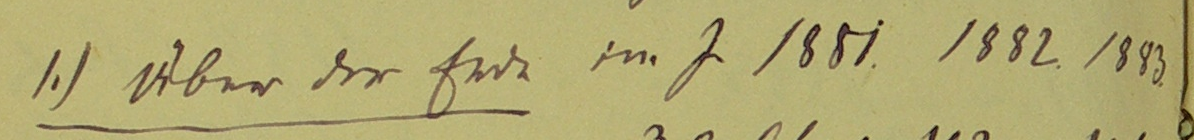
1) Oberhalb der Erde im Jahre 1881 1882 1883
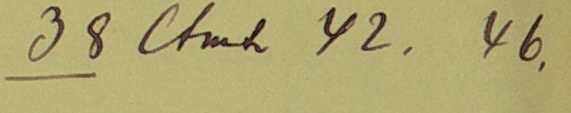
ctmtr 38 41 46
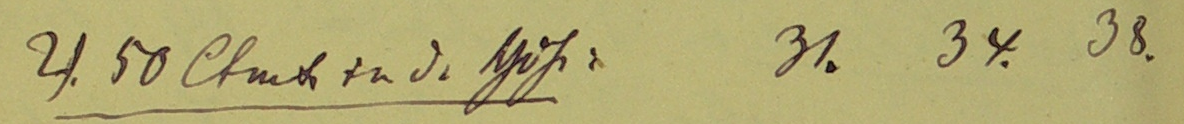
2) 50 ctmtr in der Höhe 31 34 38
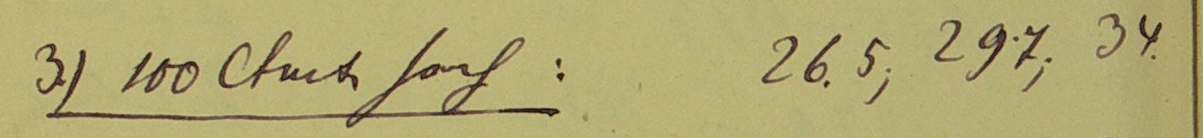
3) 100 ctmtr hoch 26,5 29,7 38
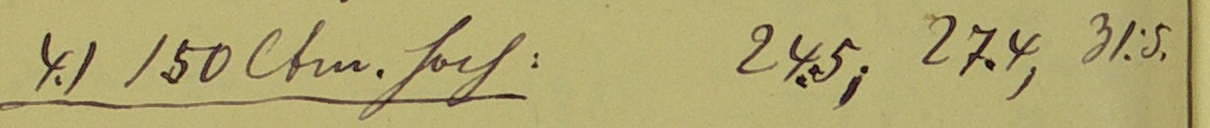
4) 150 ctmtr hoch 24,5 27,4 31,5
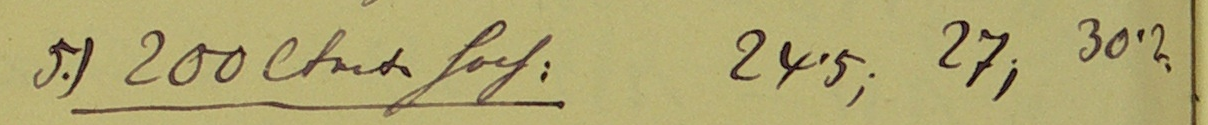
5) 200 ctmtr hoch 24,5 27 30,2
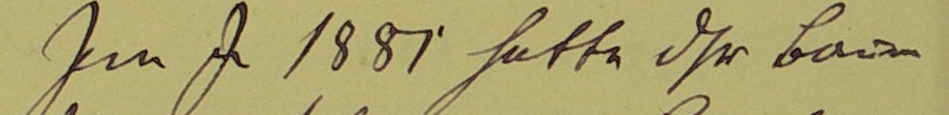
Im Jahre 1881 hatte der Baum
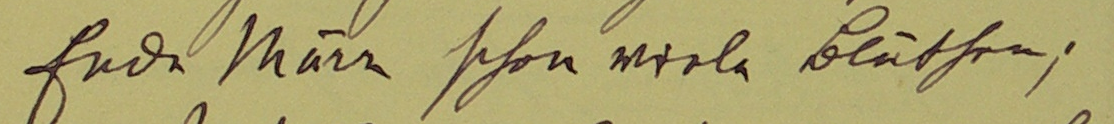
Ende März schon viele Blätter;
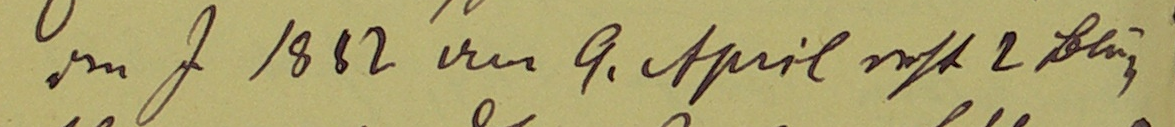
im J. 1882 am 9. April erst 2 Blä¬
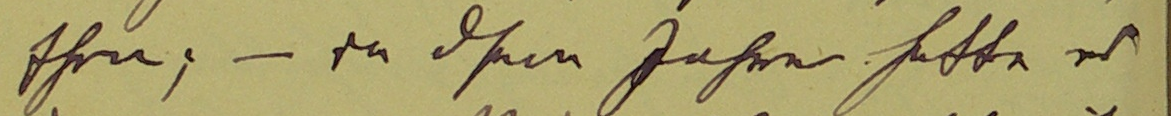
tter; - in diesem Jahr hatte es
